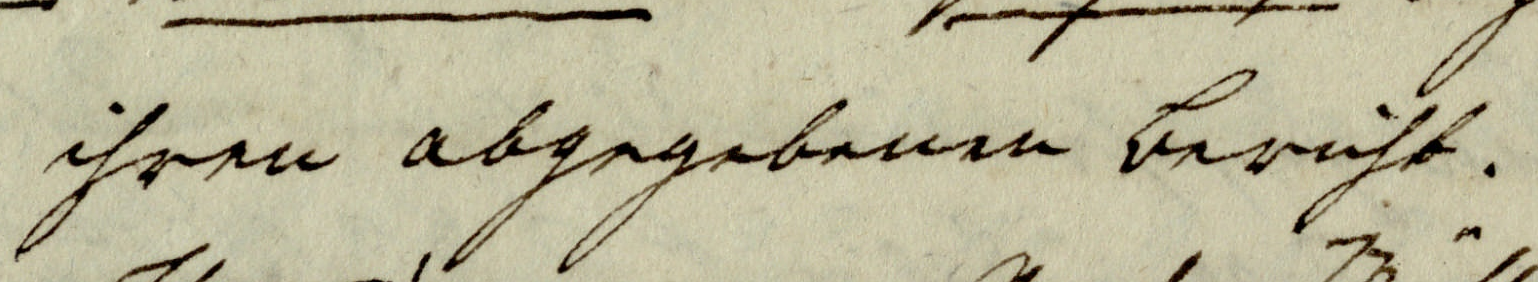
ihren abgegebenen Bericht.
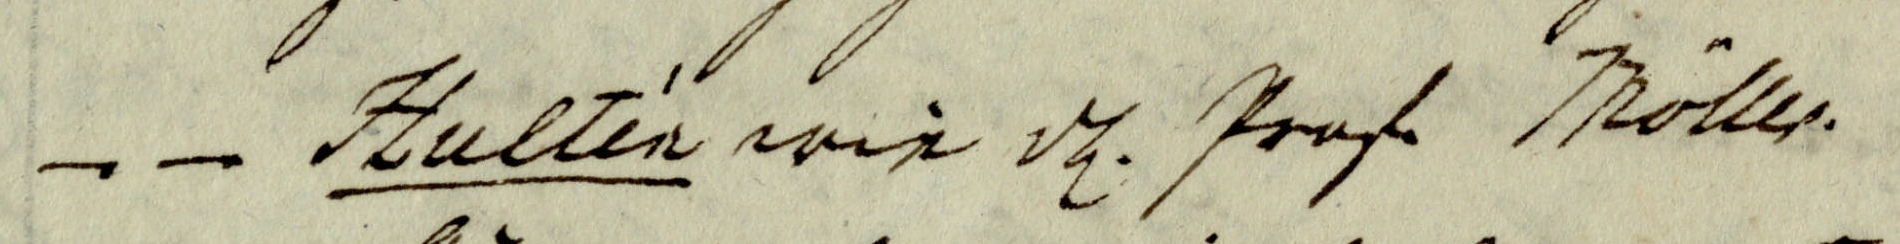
Hultén wie dh. Prof. Möller.
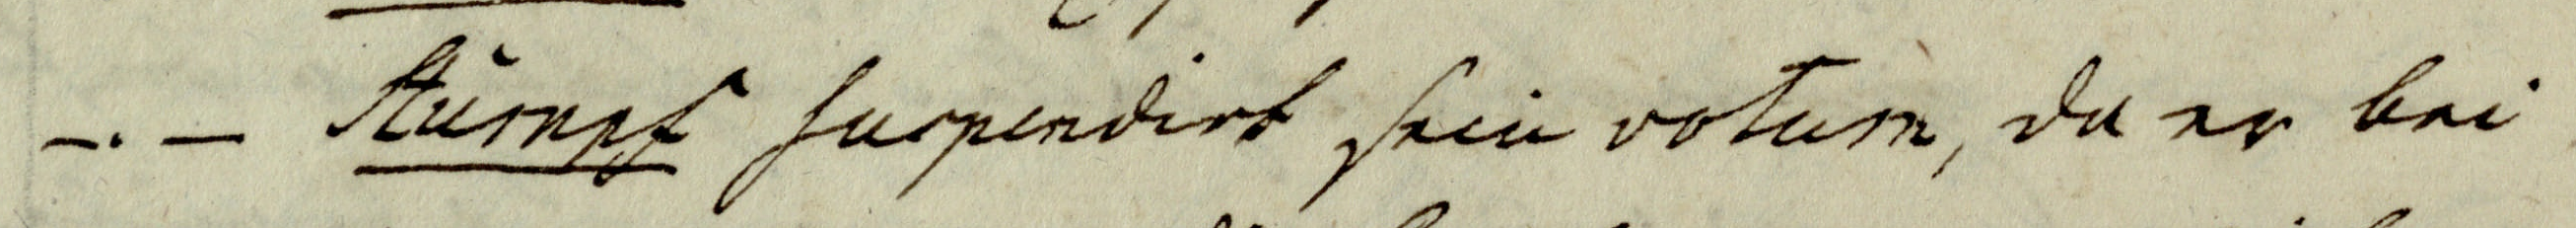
Stumpf suspendirt sein votum, da er bei
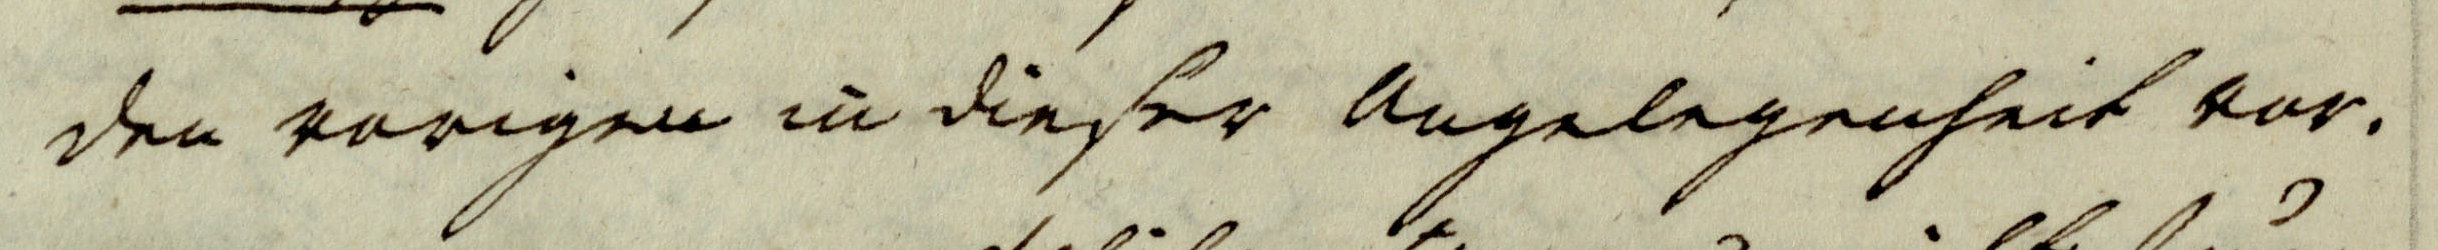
den vorigen in dieser Angelegenheit vor¬
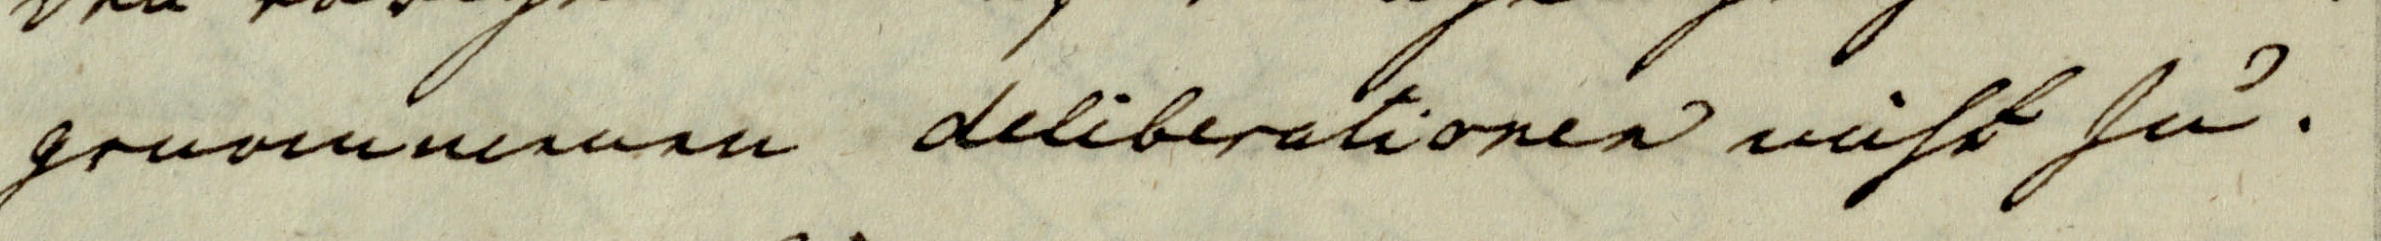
genommenen deliberationen nicht zu¬
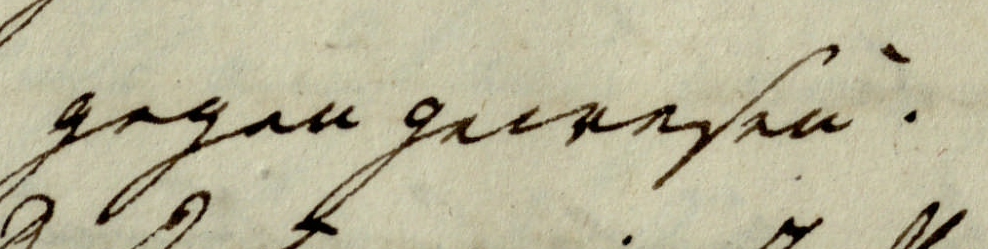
gegen gewesen.
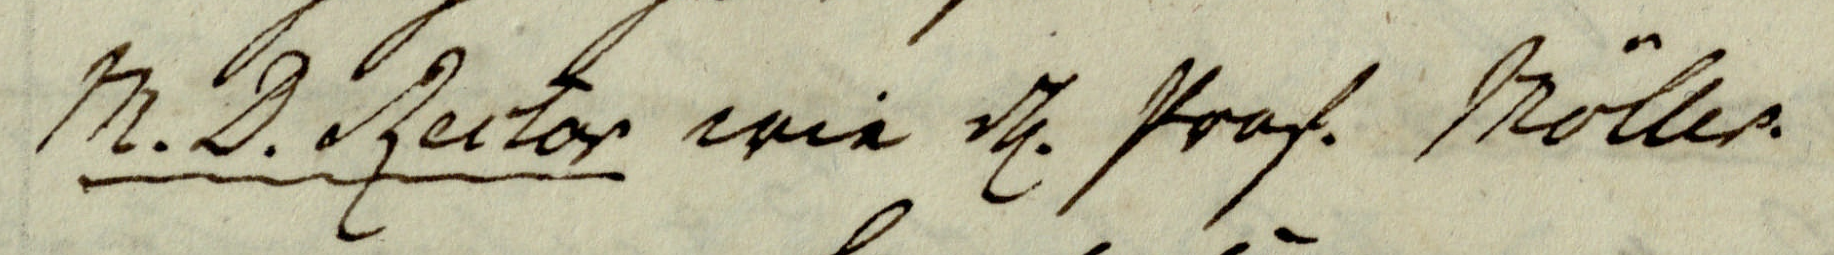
M. D. Rector wie dh. Prof. Möller.
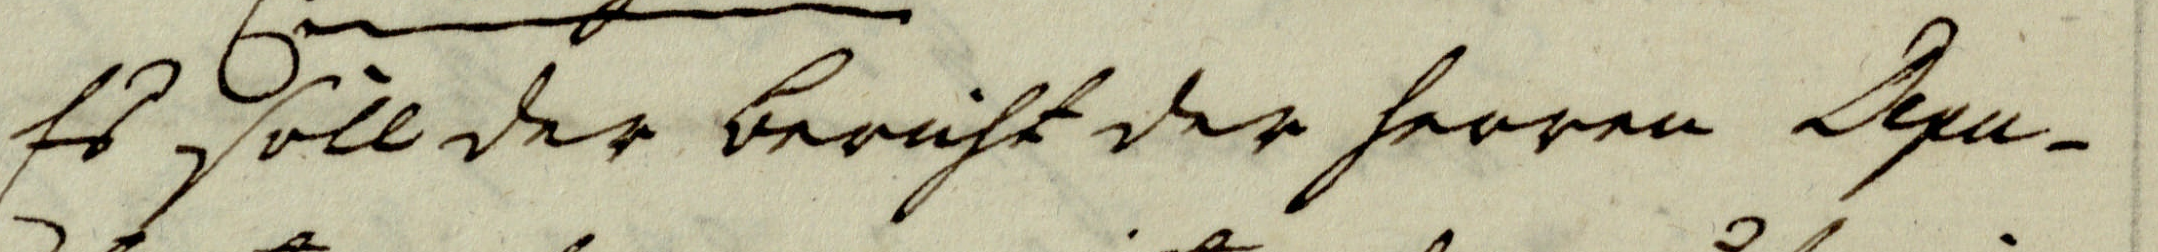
Es soll der Bericht der Herren Depu¬
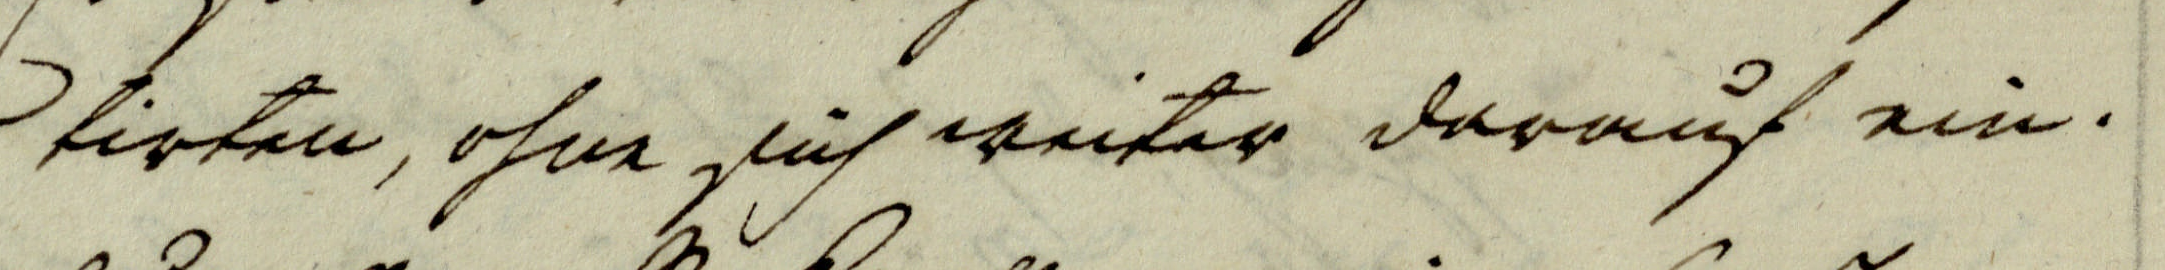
tirten, ohne sich weiter darauf ein¬
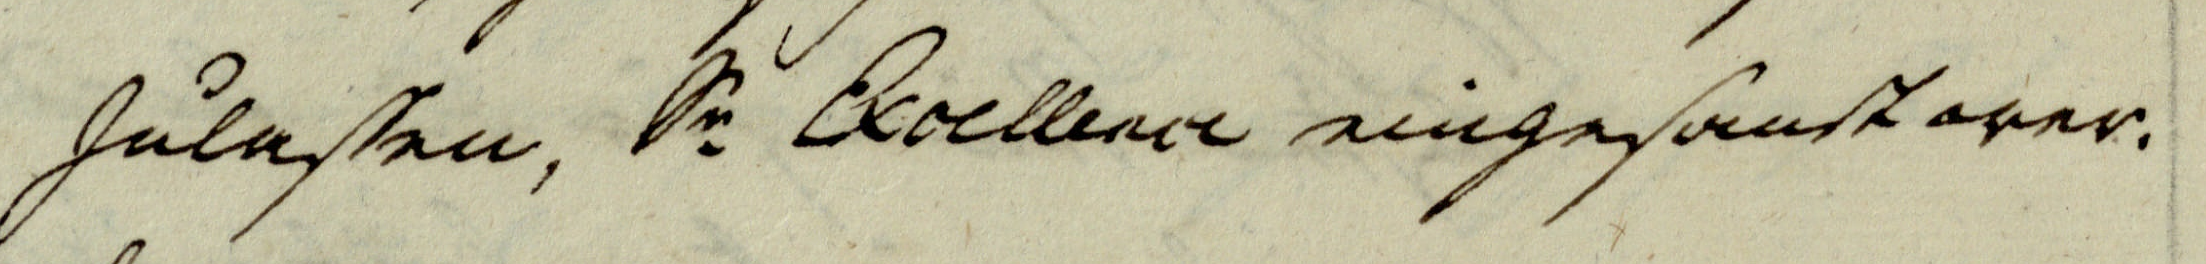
zulassen, Sr. Excellence eingesandt wer¬
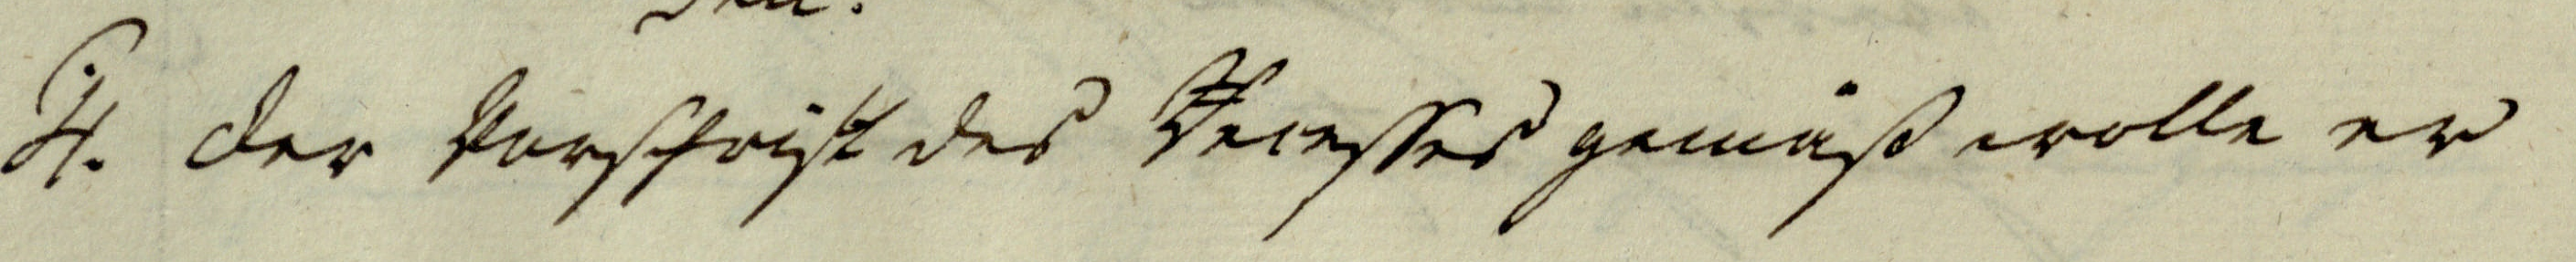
4. Der Vorschrift des Recesses gemäß wolle er
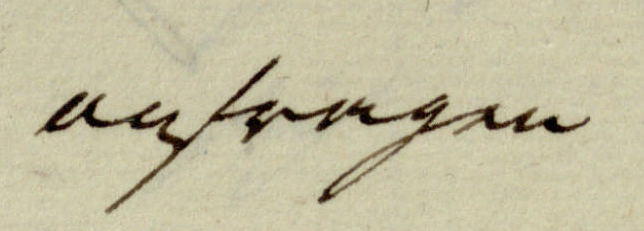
anfragen
